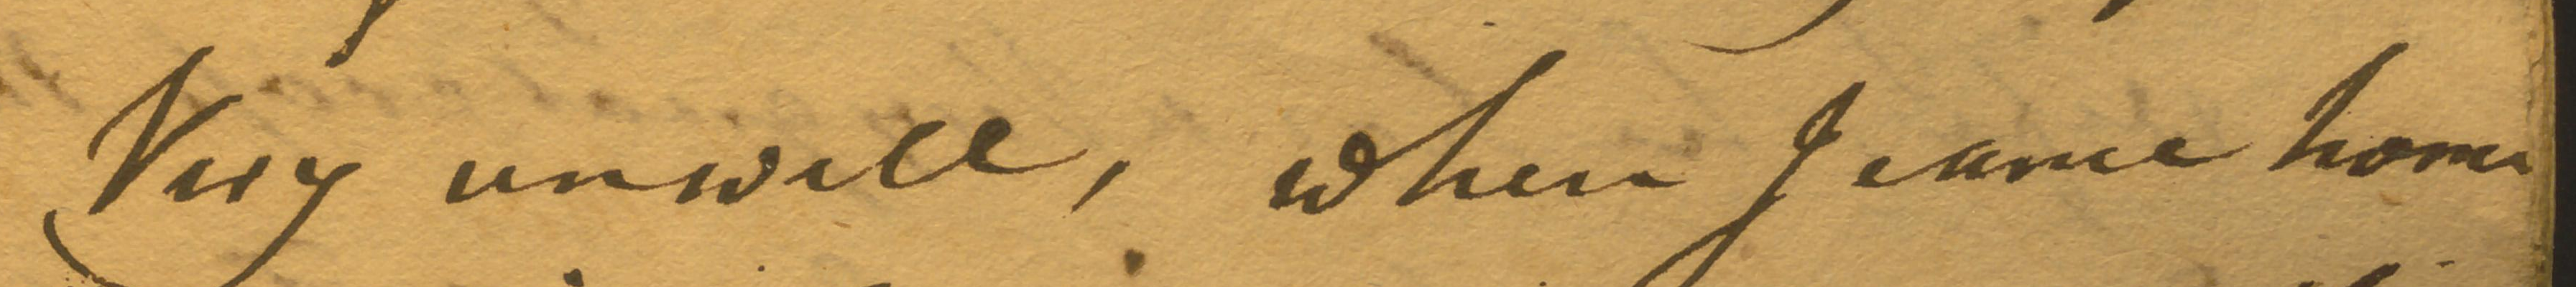Very unwell, when I came home
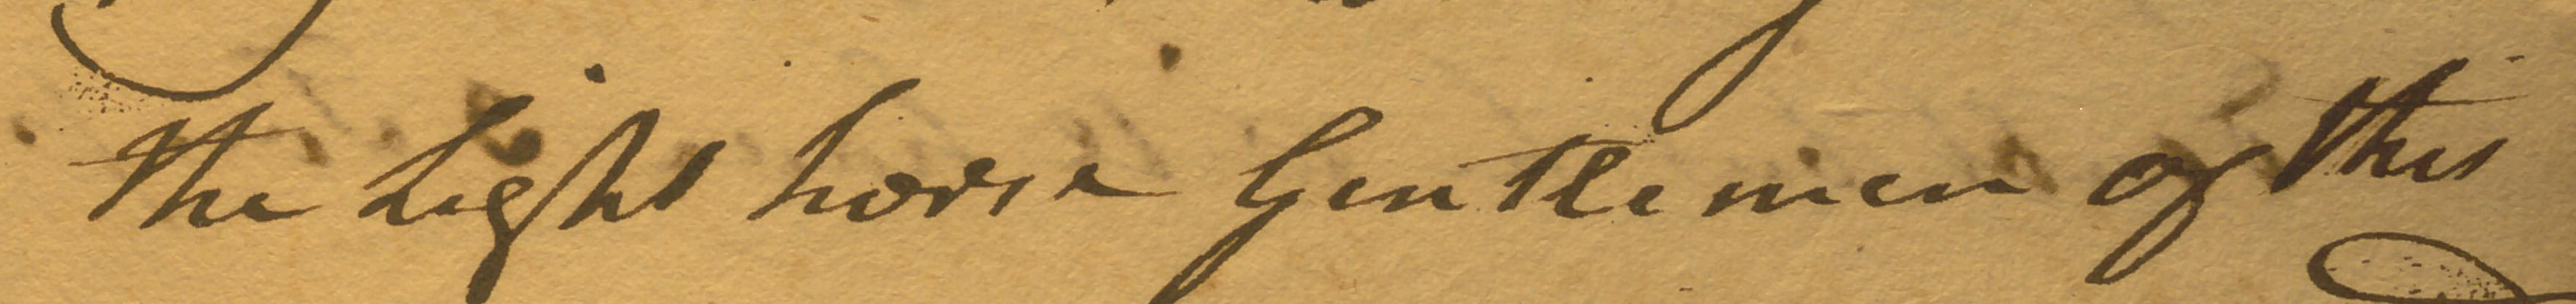the Light horse Gentlemen of this
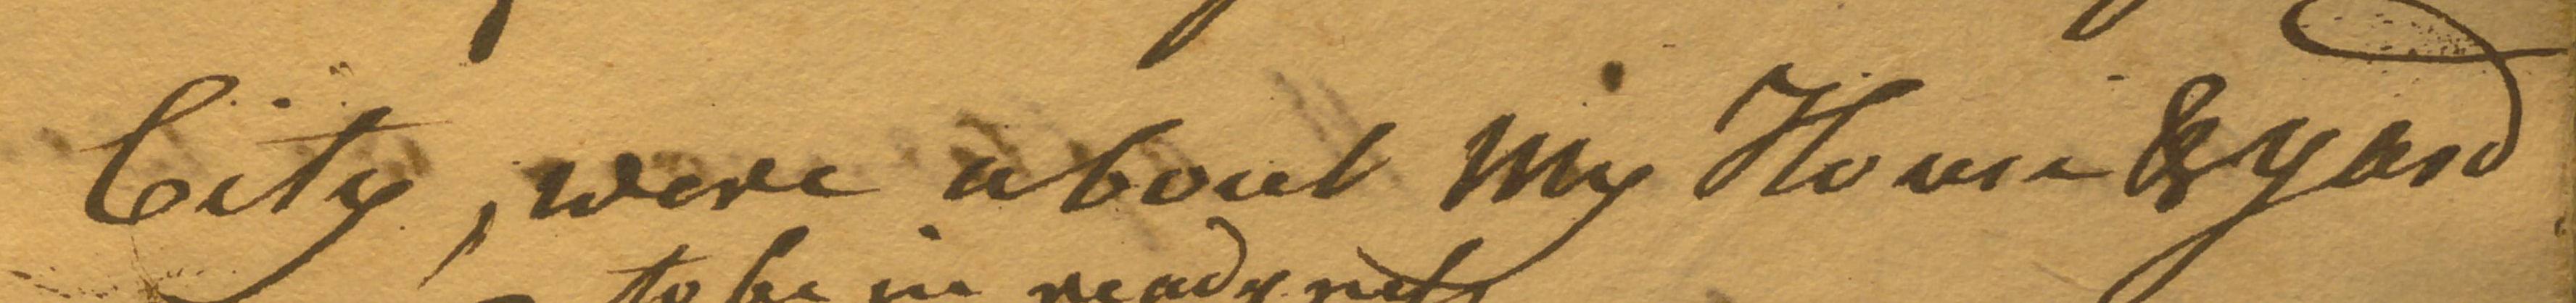City, were about my House & yard
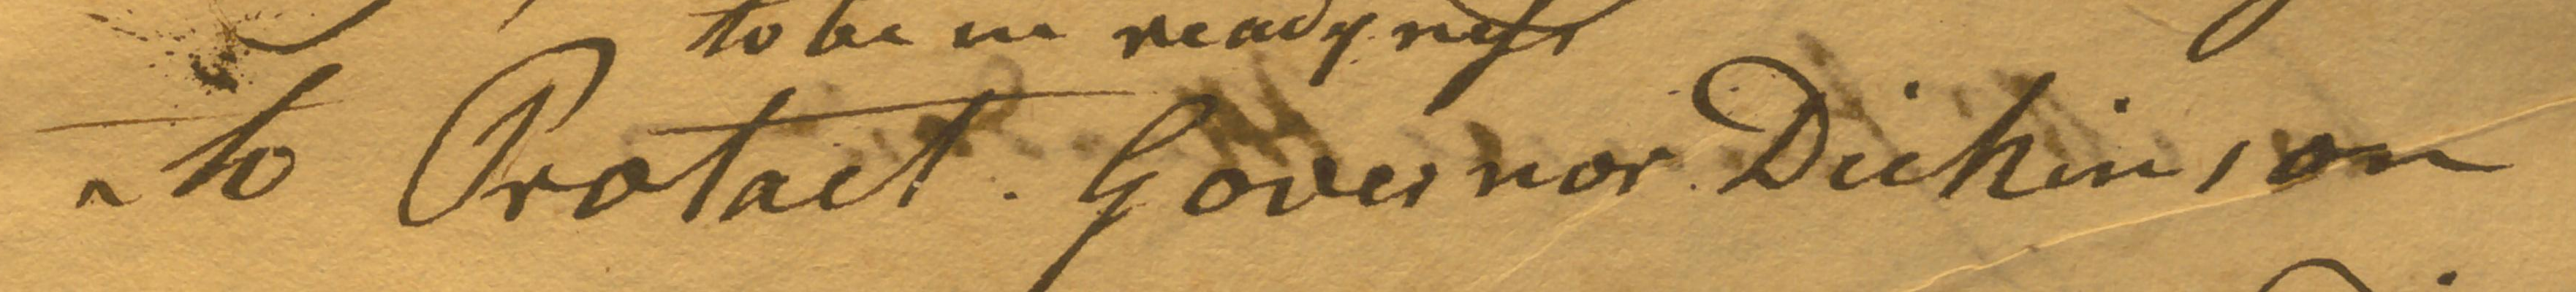^ to Protect. Governor Dickinson
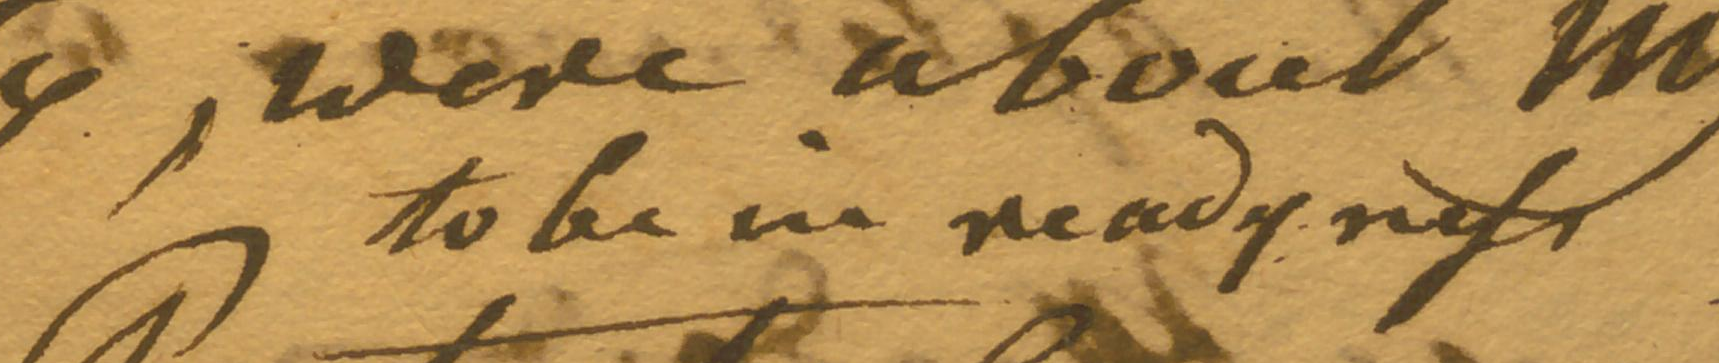to be in readyness
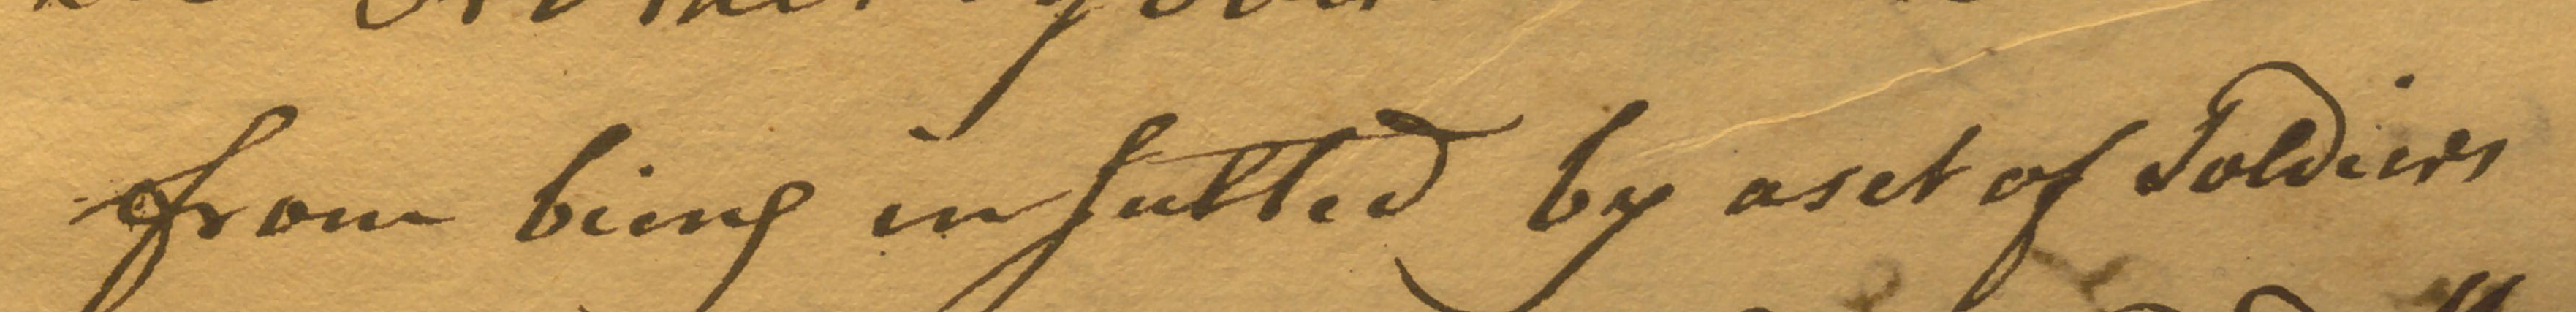from being insulted by a set of Soldiers
